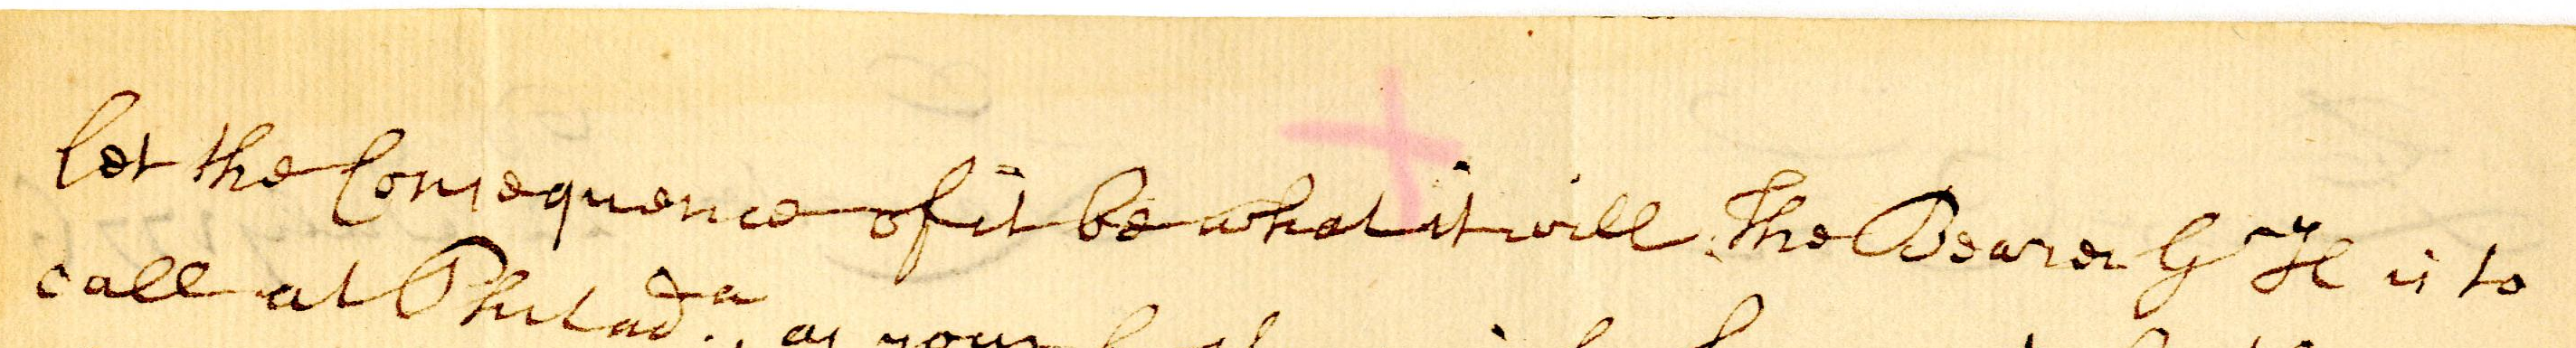let the Consequence of it be what it will The Bearer G^r H is to
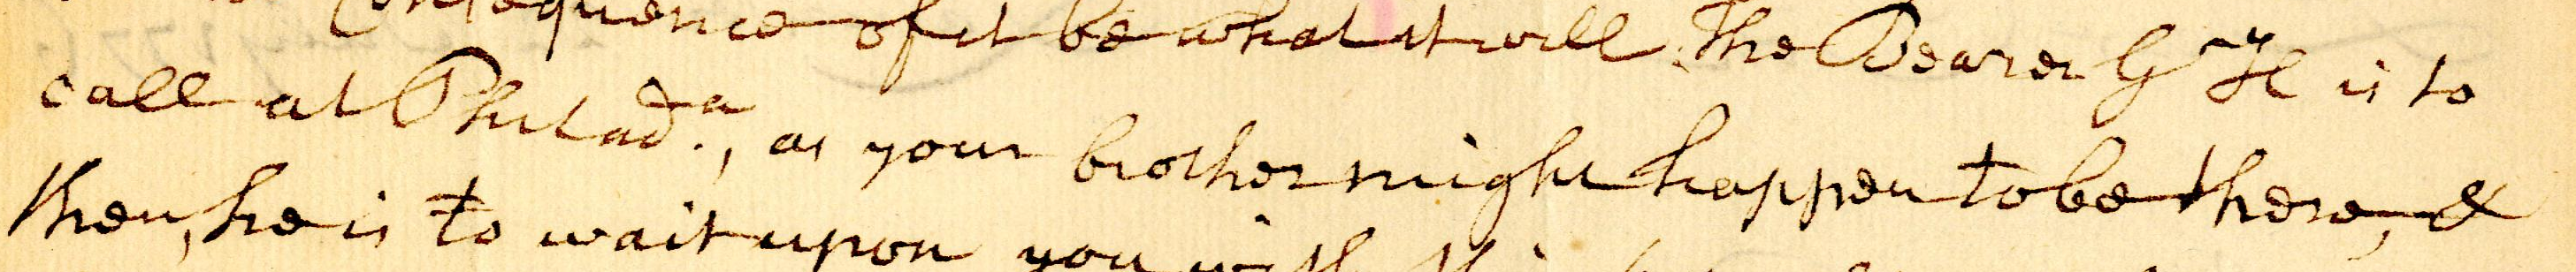call at Philad.^a, as your brother might happen to be there, &
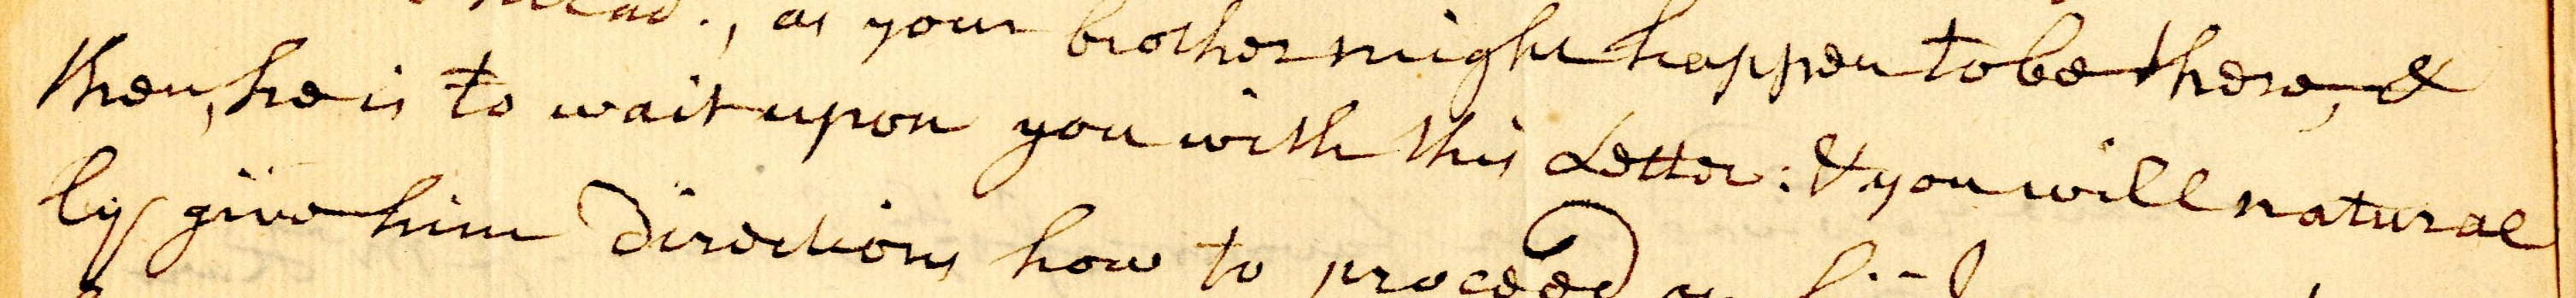then, he is to wait upon you with this Letter: & you will natural
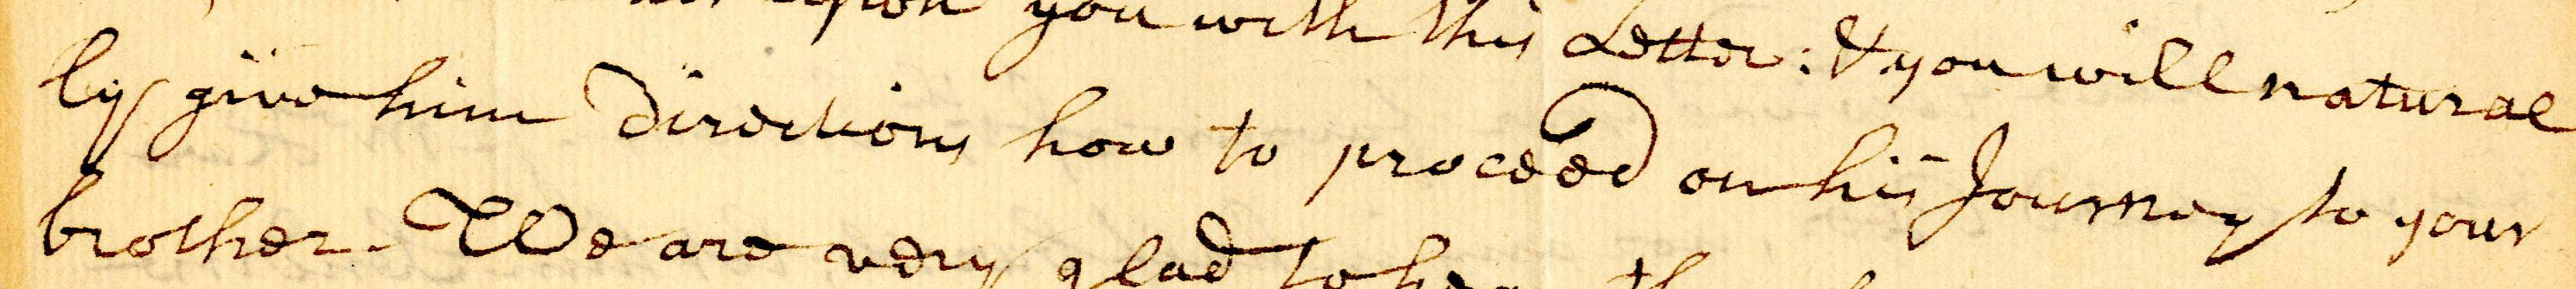ly give him directions how to proceed on his Journey to your
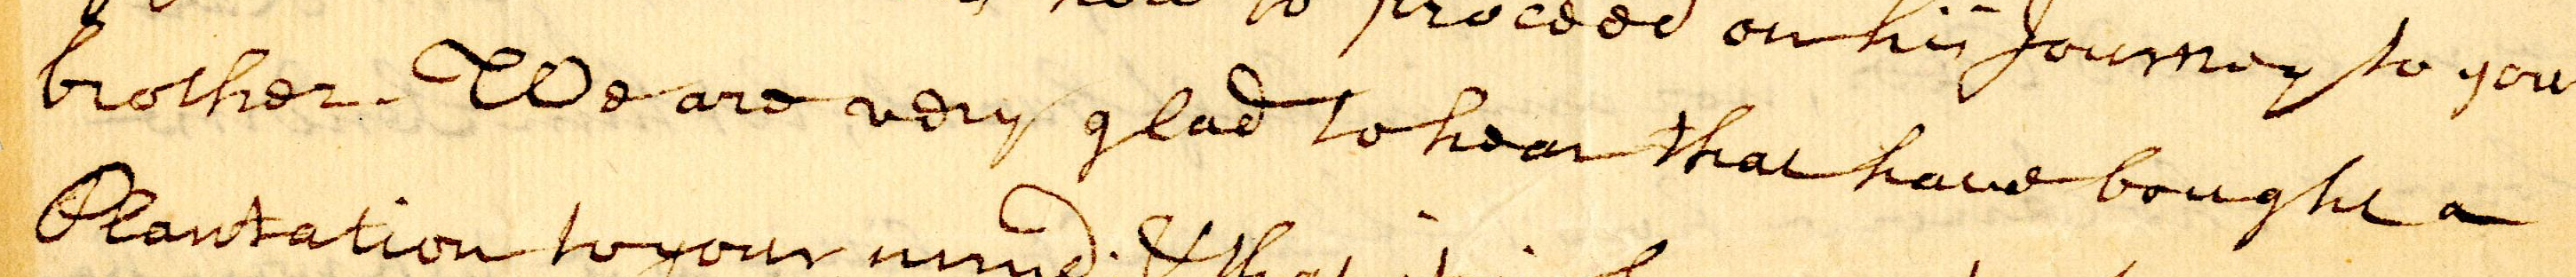brother- We are very glad to hear that have bought a
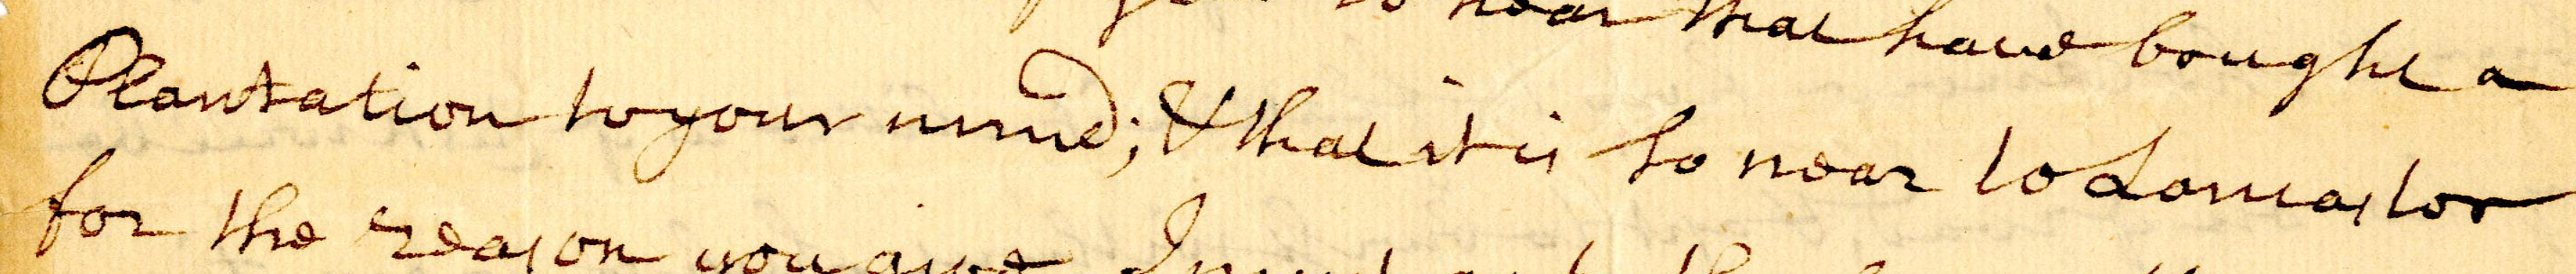Plantation to your mind; & that it is so near to Lancaster
